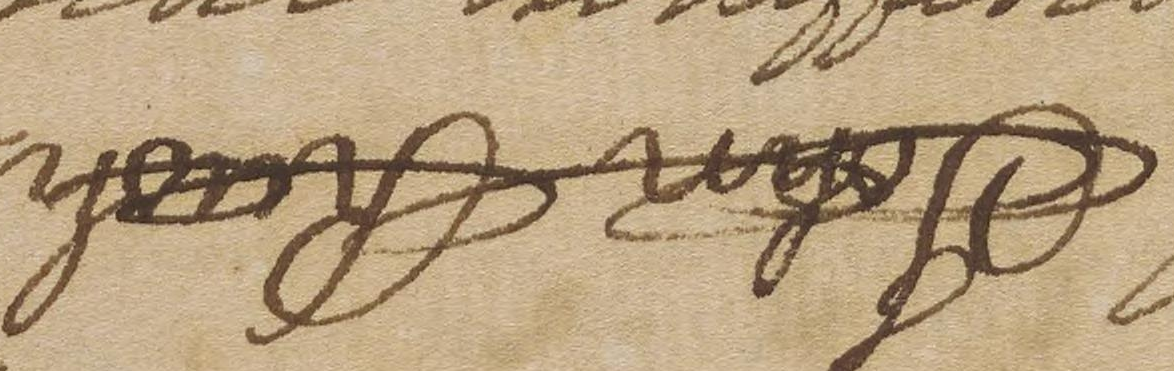[John Rush]
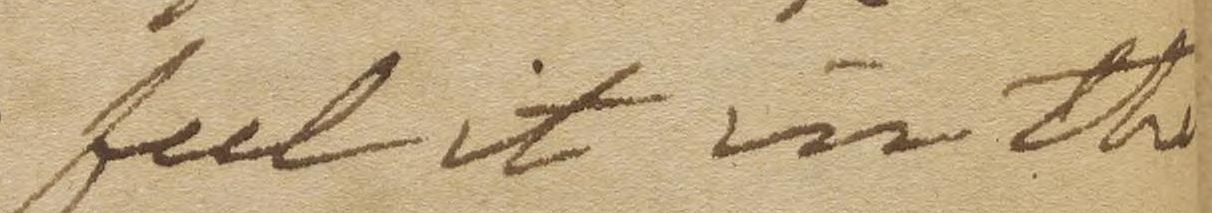feel it in the
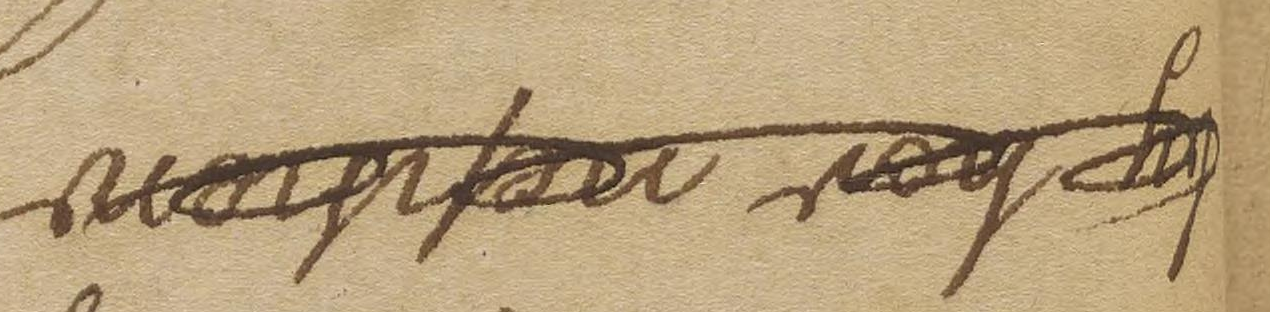[by her nephew]
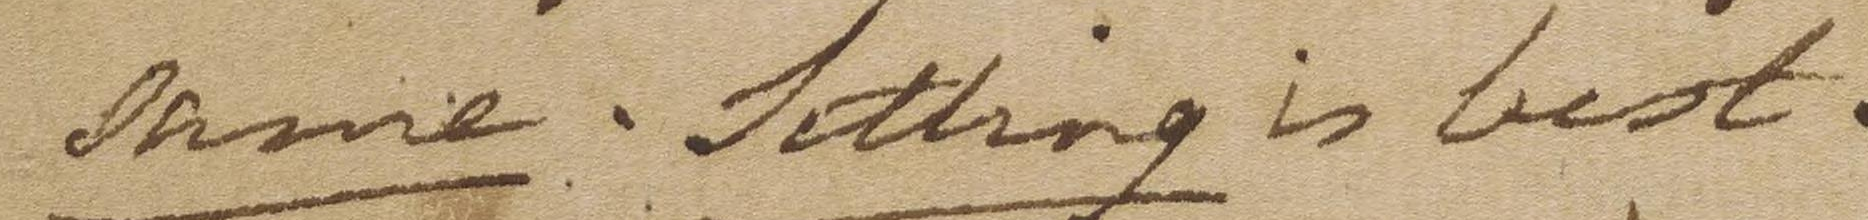same. Setting is best
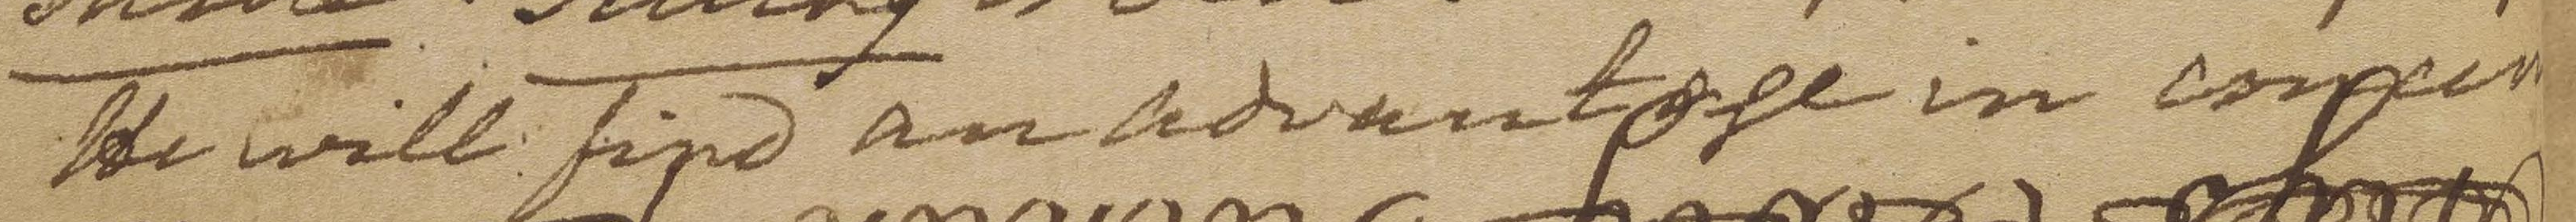He will find an advantage in concen
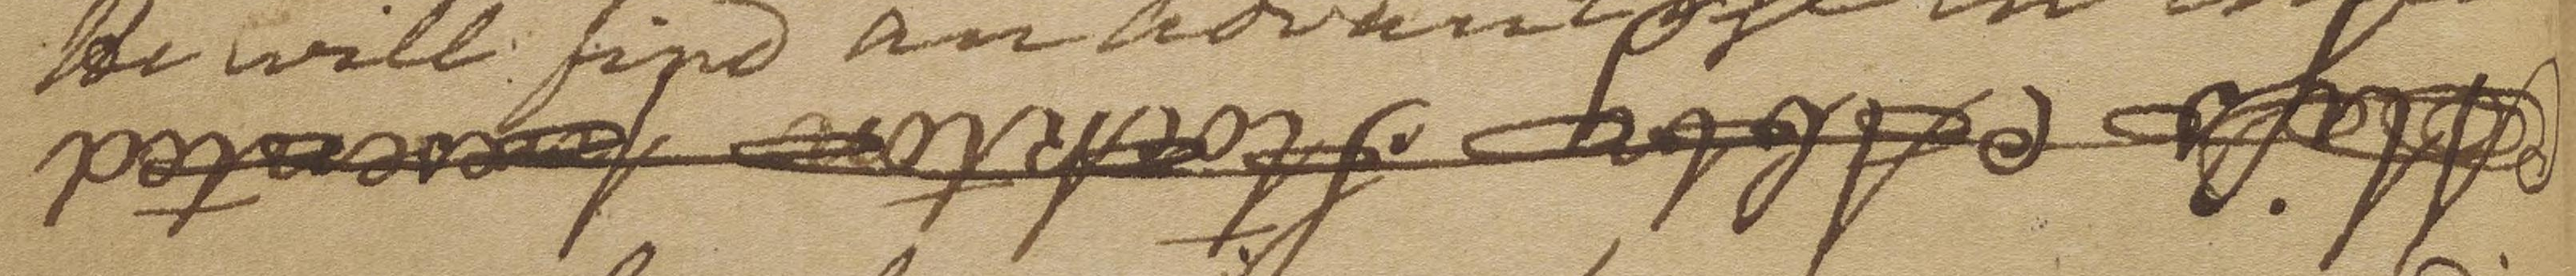[Miss Abby Stockton presented]
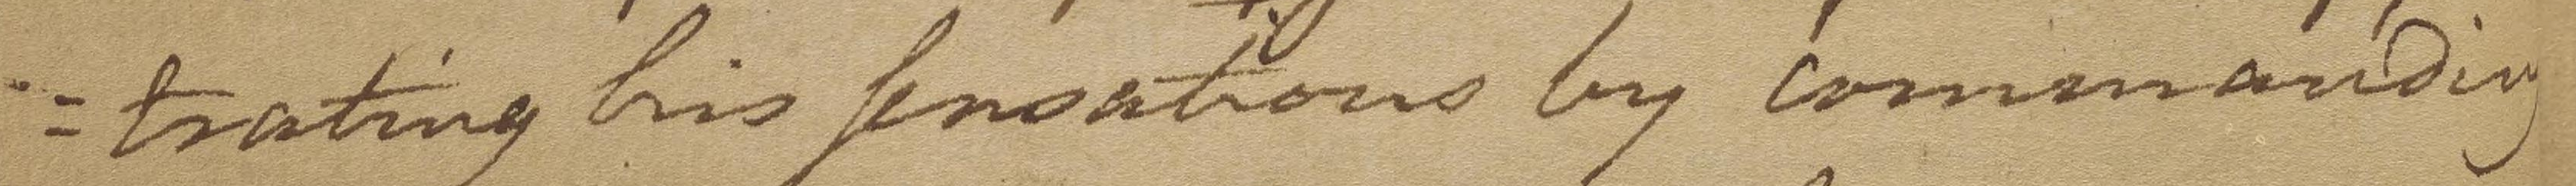-trating his sensations by commanding
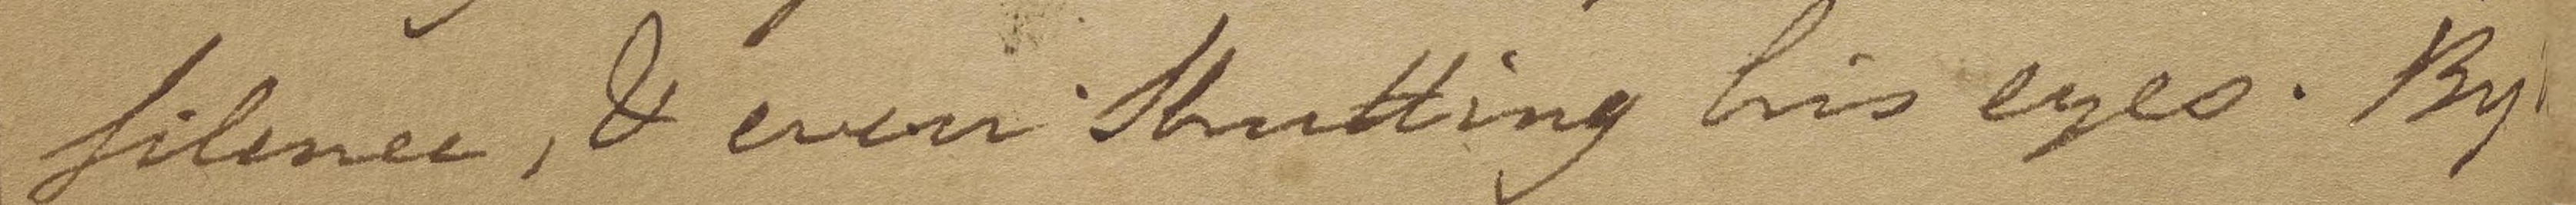silence, & even shutting his eyes. By
